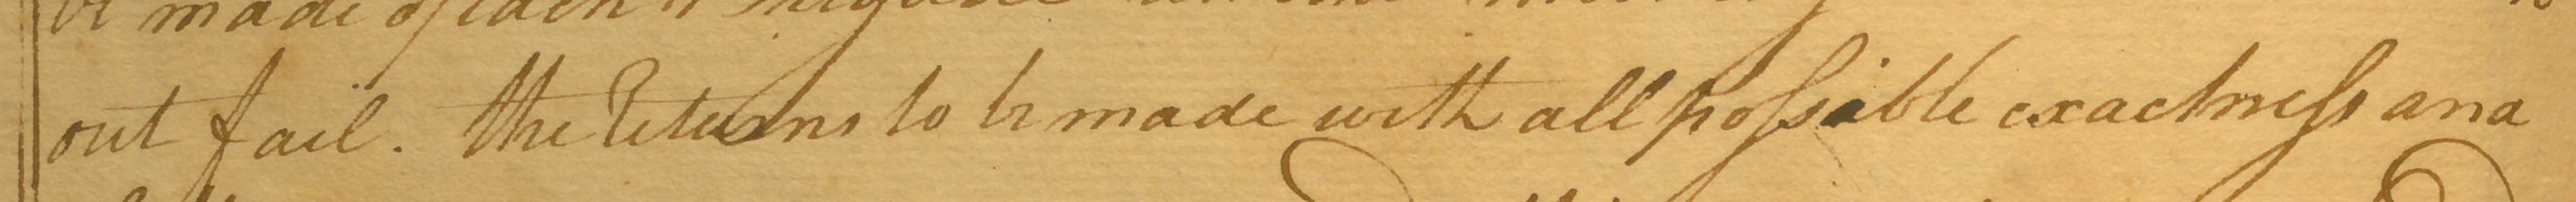out fail. the returns to be made with all possible exactness and
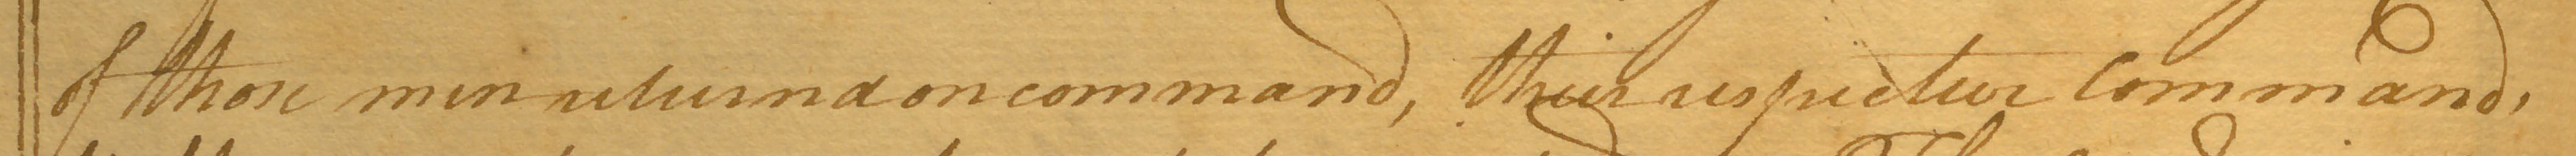of those men returnd on command, their respective command,
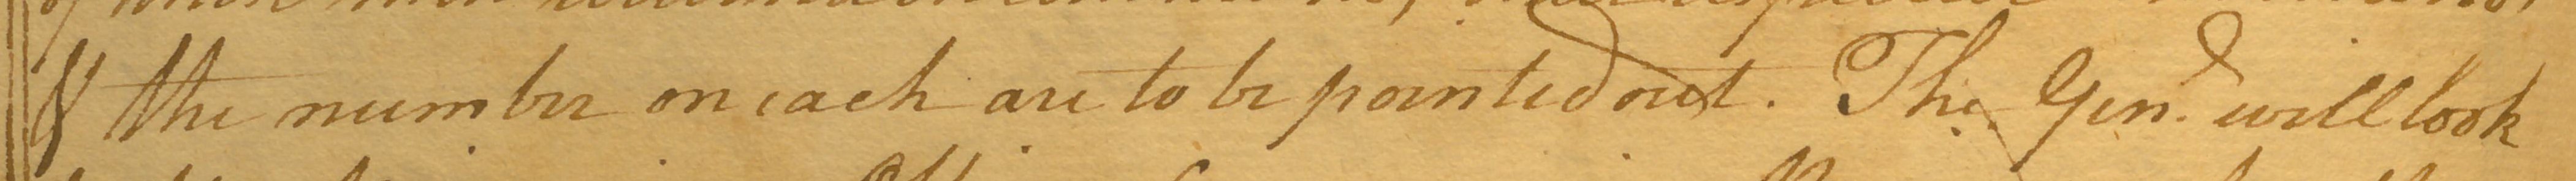& the number on each are to be pointed out. The Gen^l. will look
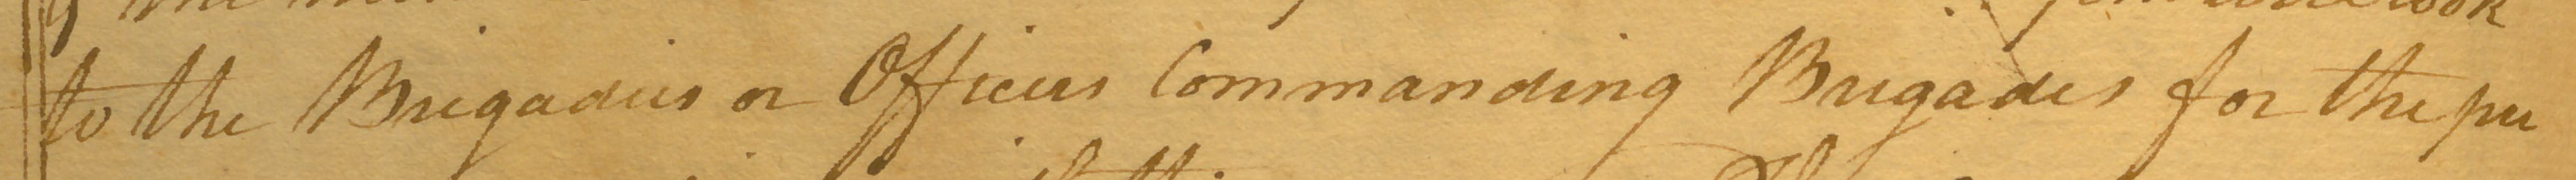to the Brigadier or Officer Commanding Brigades for the pu
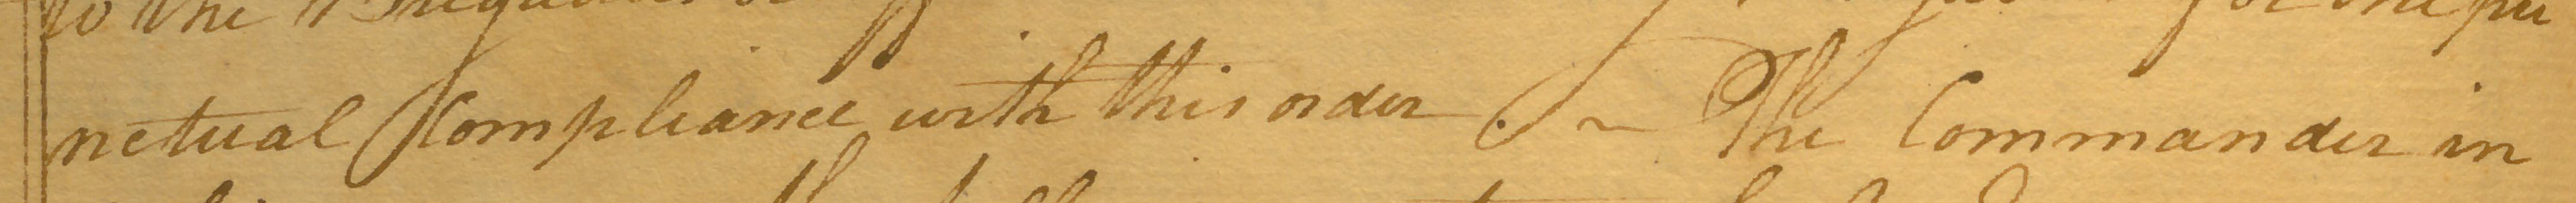nctual compliance with this order.- The Commander in
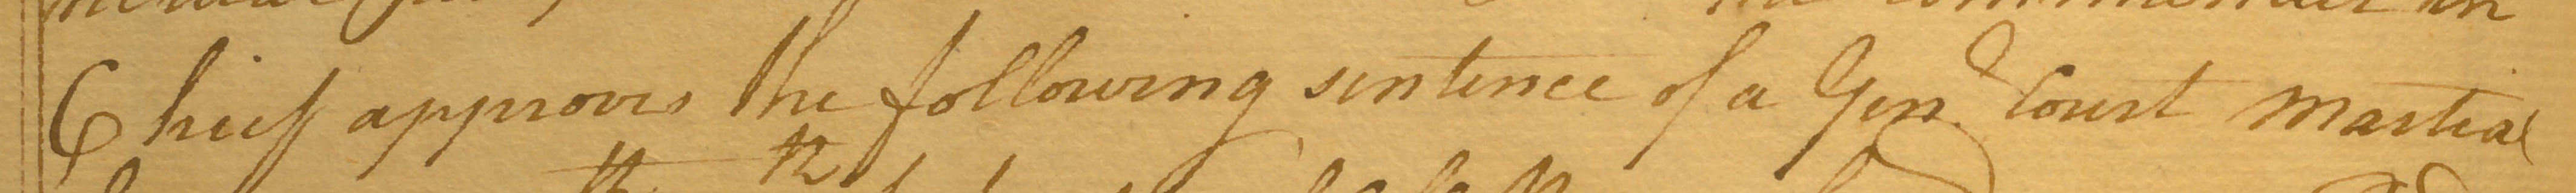Chief approves the following sentence of a Gen^l. Court martial
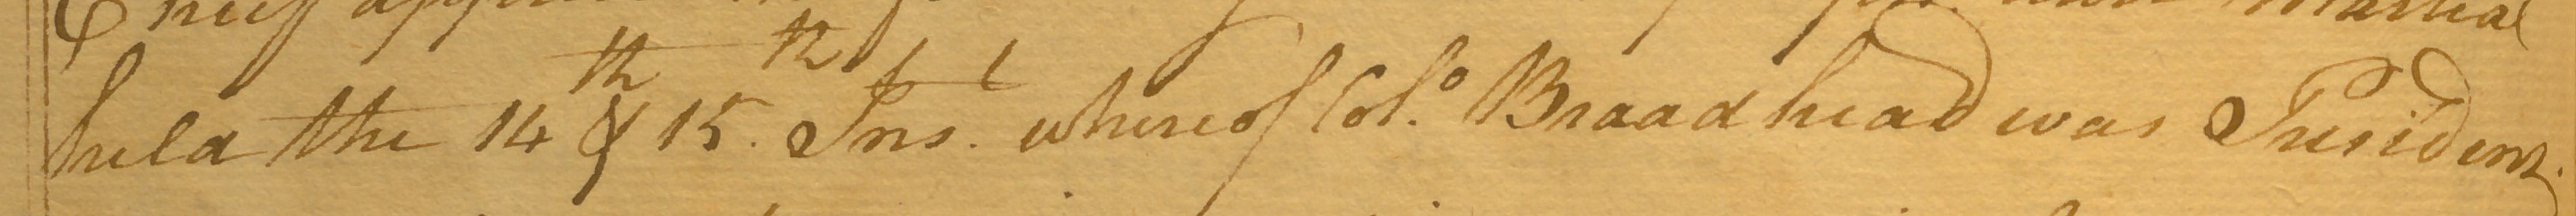held the 14^th & 15^th. Inst^. whereof Col^o. Broadhead was President
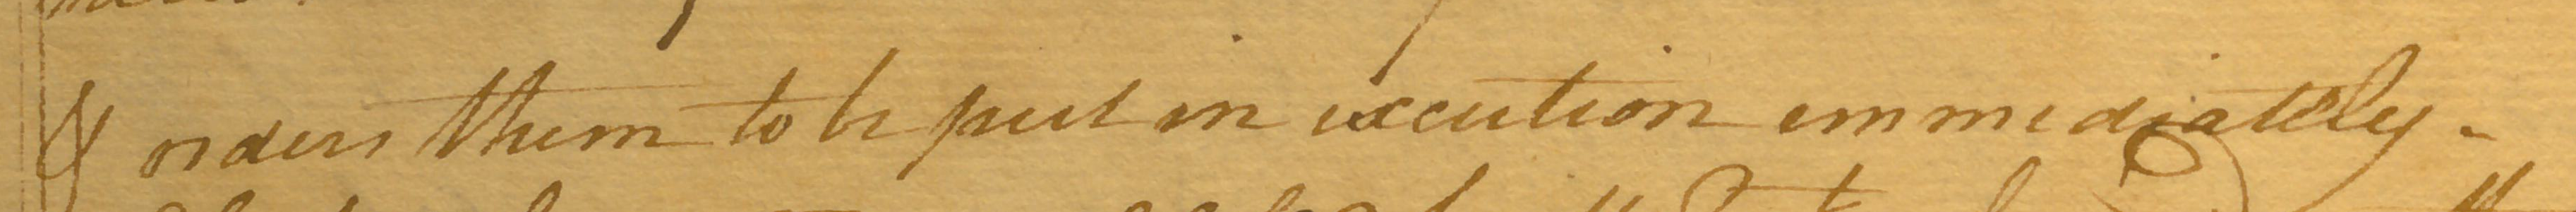& orders them to be put in execution immediately.
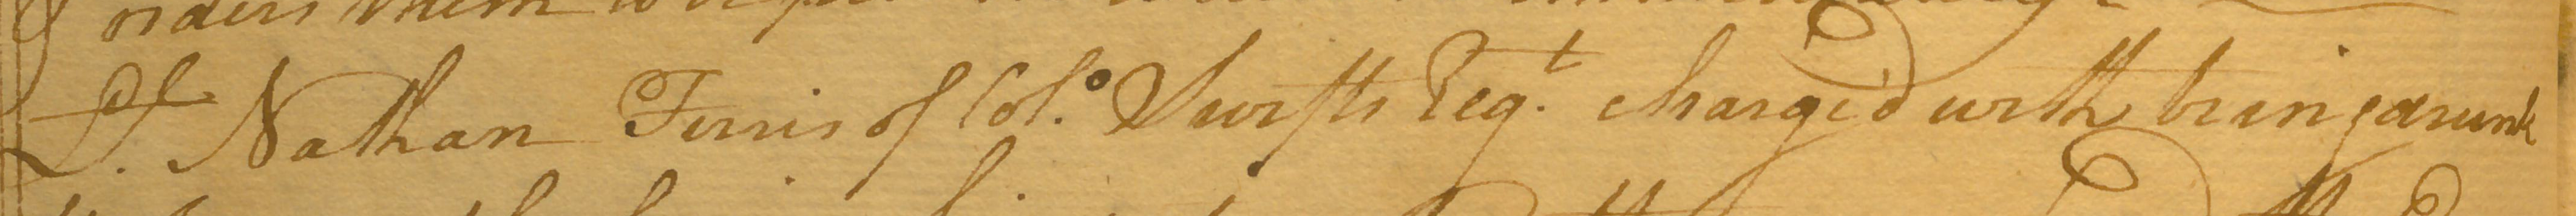L^t. Natahn Ferris of Col^o. Swifts Reg^t. charg'd with being drunk
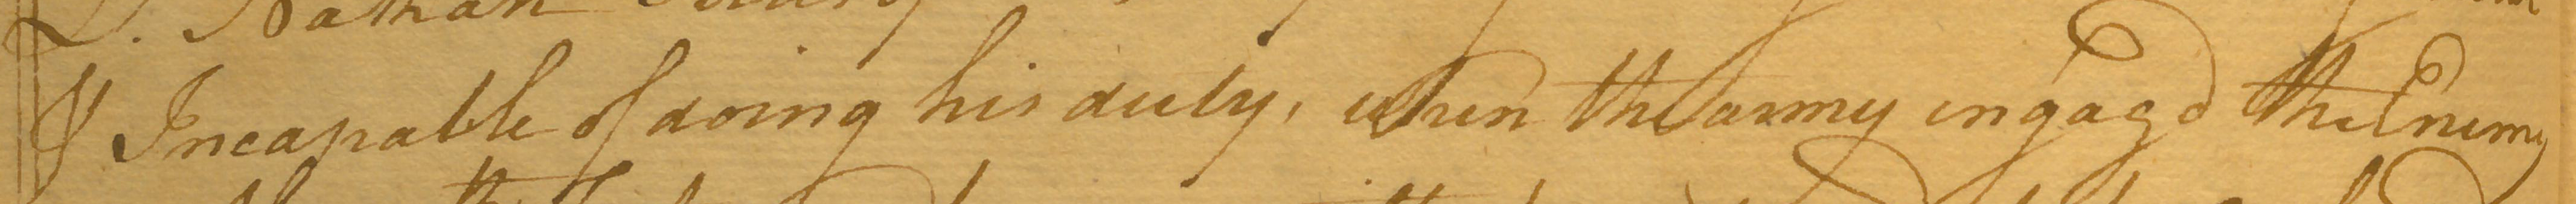& Incapable of doing his duty, when the army engag'd the Enemy
